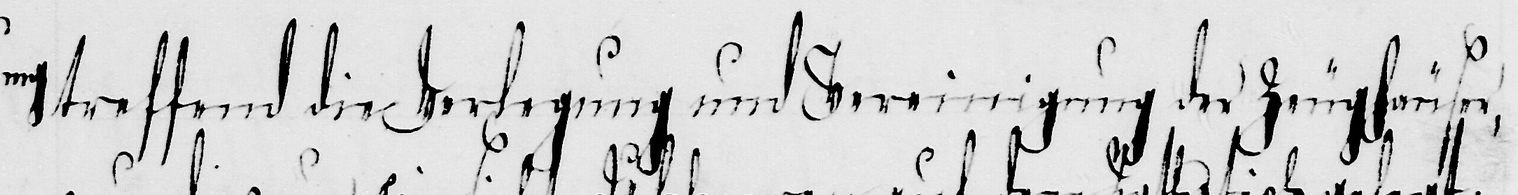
treffend die Verlegung und Vereinigung der Zeughäuse¬
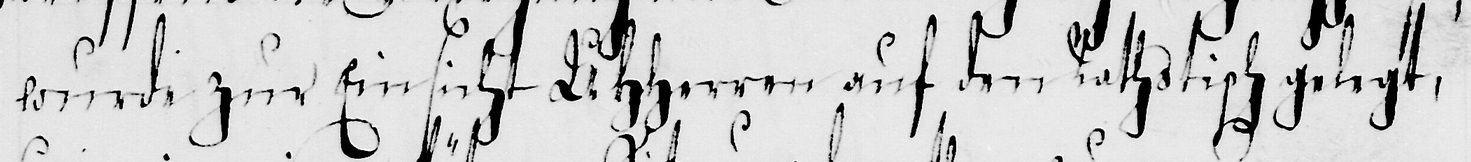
wurde zur Einsicht UHHerren auf den Rathstisch gelegt,
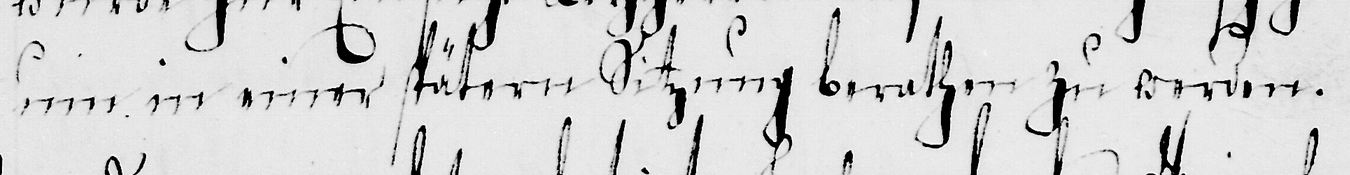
um in einer spätern Sitzung berathen zu werden.
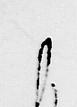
se
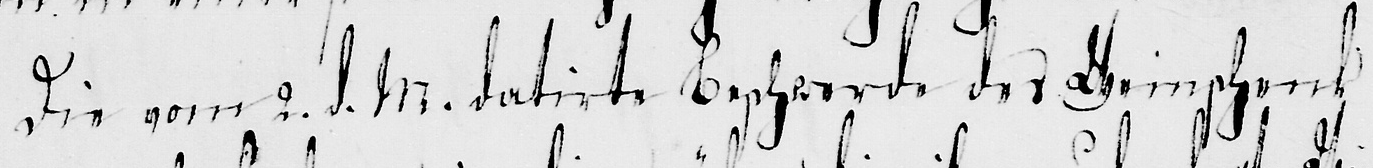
Die vom 2. d. M. datirte Beschwerde des Weinschenk
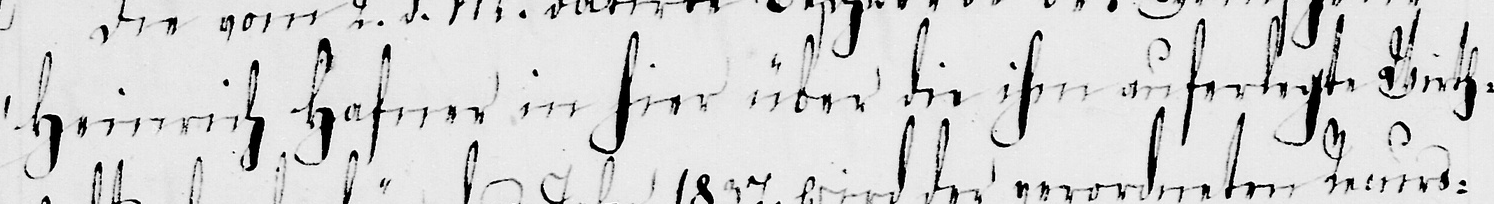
Heinrich Hafner in hier über die ihm auferlegte Wirth¬
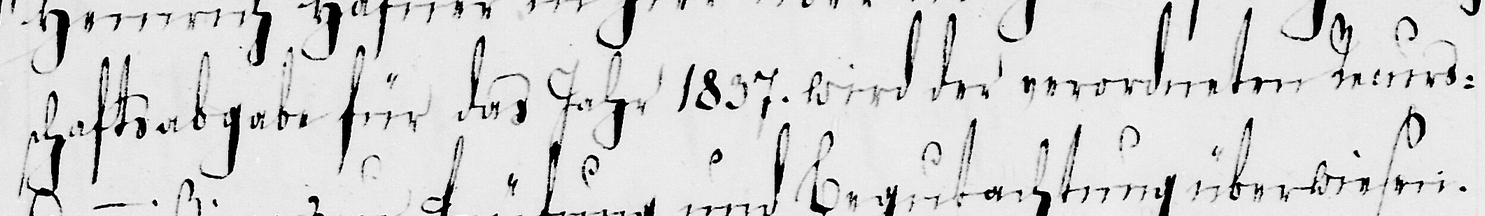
schaftsabgabe für das Jahr 1837. wird der verordneten Recur¬
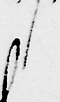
tt,
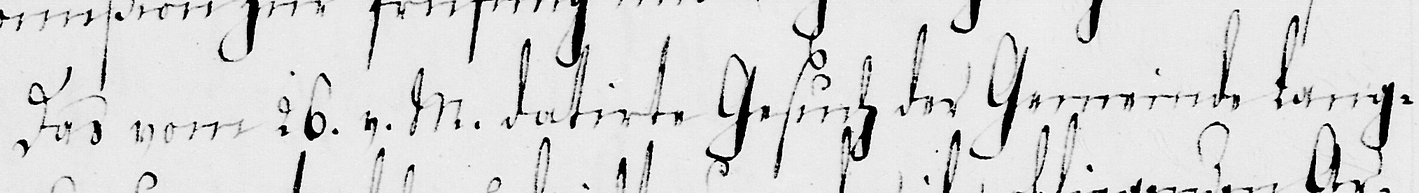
Das vom 26 v. M. datirte Gesuch der Gemeinde Lang¬
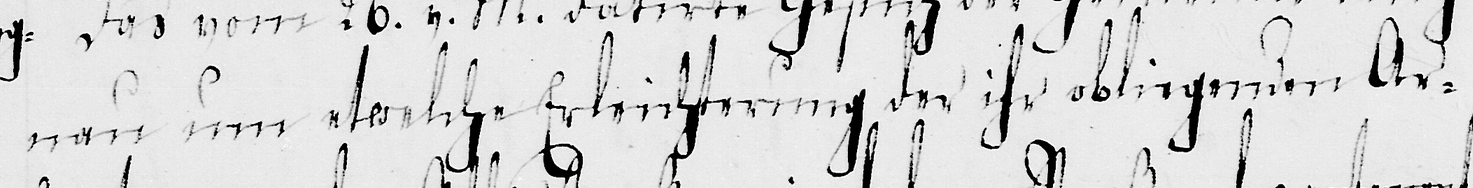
nau um etwelche Erleichterung der ihr obliegenden Ar¬
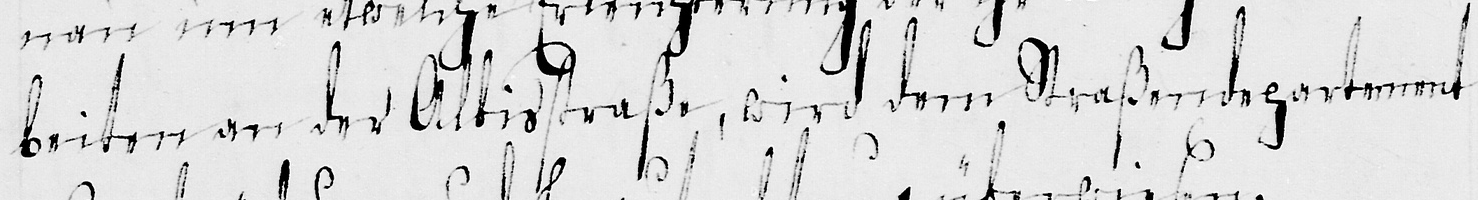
beiten an der Albisstraße, wird dem Straßendepartement
